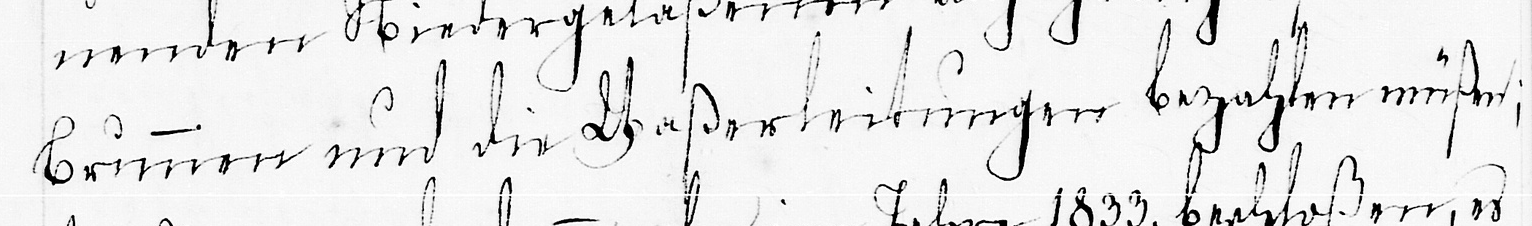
Brunnen und die Waßerleitungen bezahlen müßen;
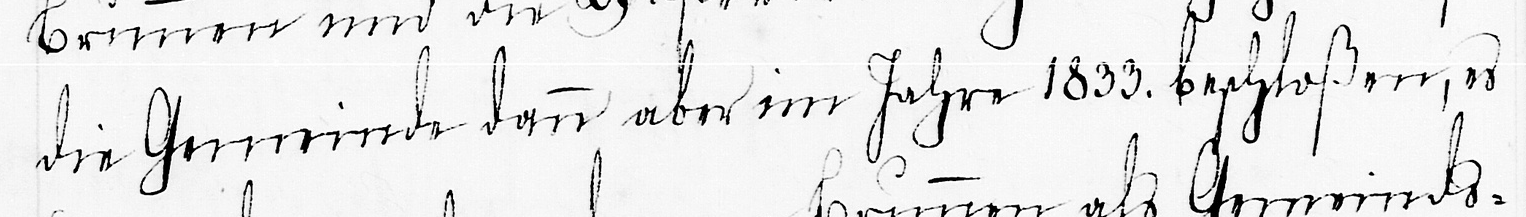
die Gemeinde dann aber im Jahre 1833. beschloßen, es
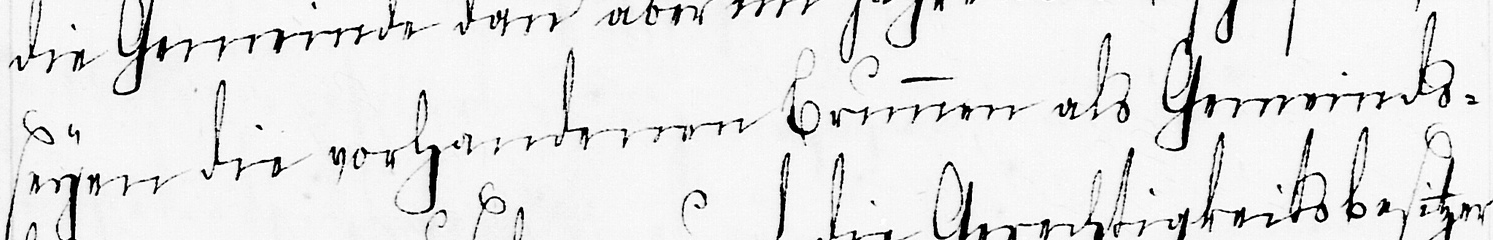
seyen die vorhandenen Brunnen als Gemeinds¬
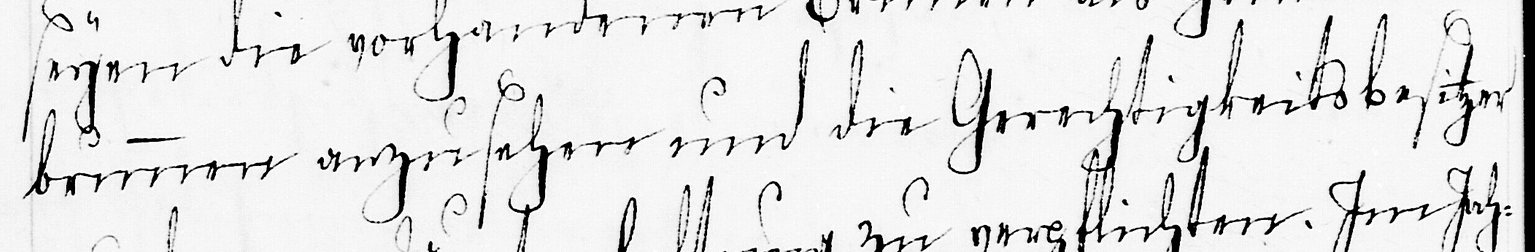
brunnen anzusehen und die Gerechtigkeitsbesitzer
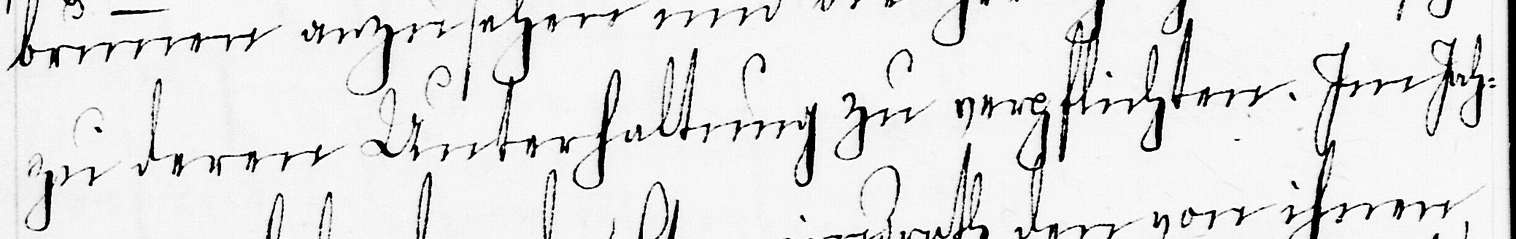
zu deren Unterhaltung zu verpflichten. Im Jah¬
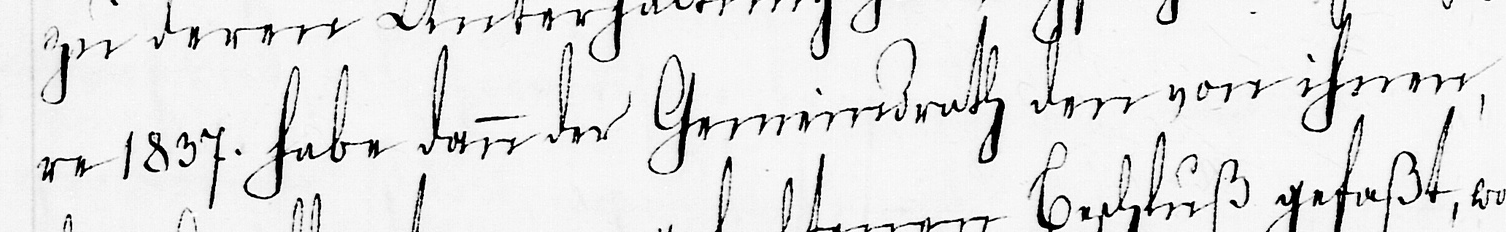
re 1837. habe dann der Gemeindrath den von ihnen,
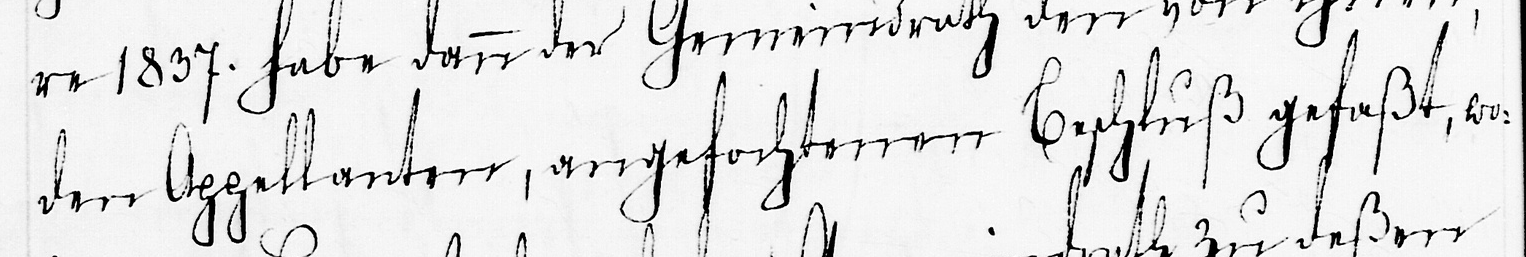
den Appelanten, angefochtenen Beschluß gefaßt, w¬
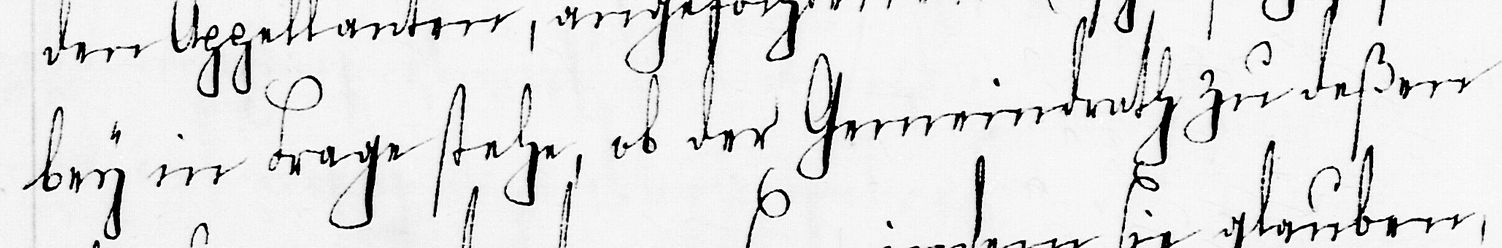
obey in Frage stehe, ob der Gemeindrath zu deßen
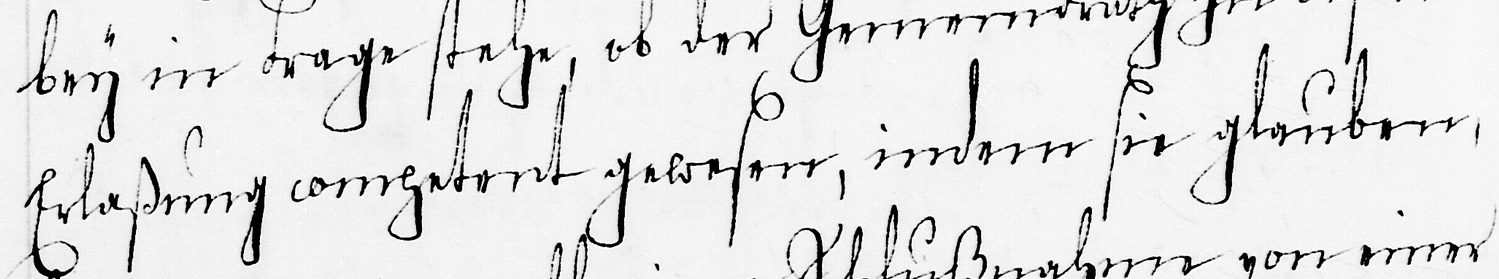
Erlaßung competent gewesen, indem sie glauben,
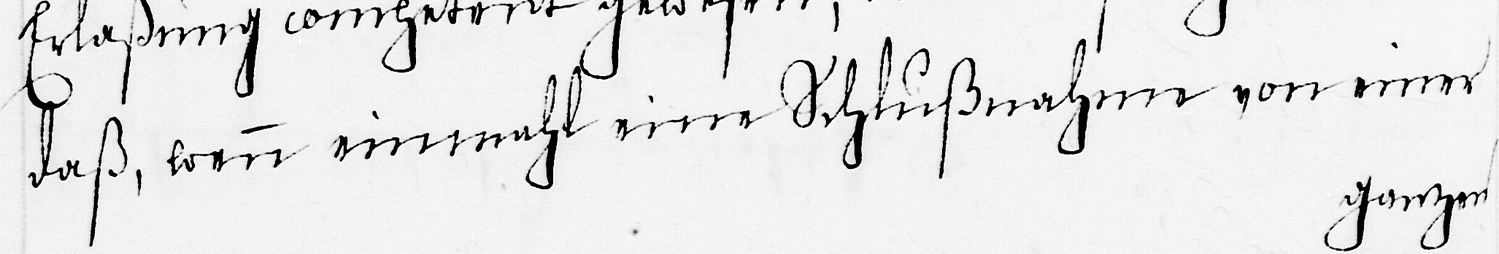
daß, wenn einmahl eine Schlußnahme von einer
